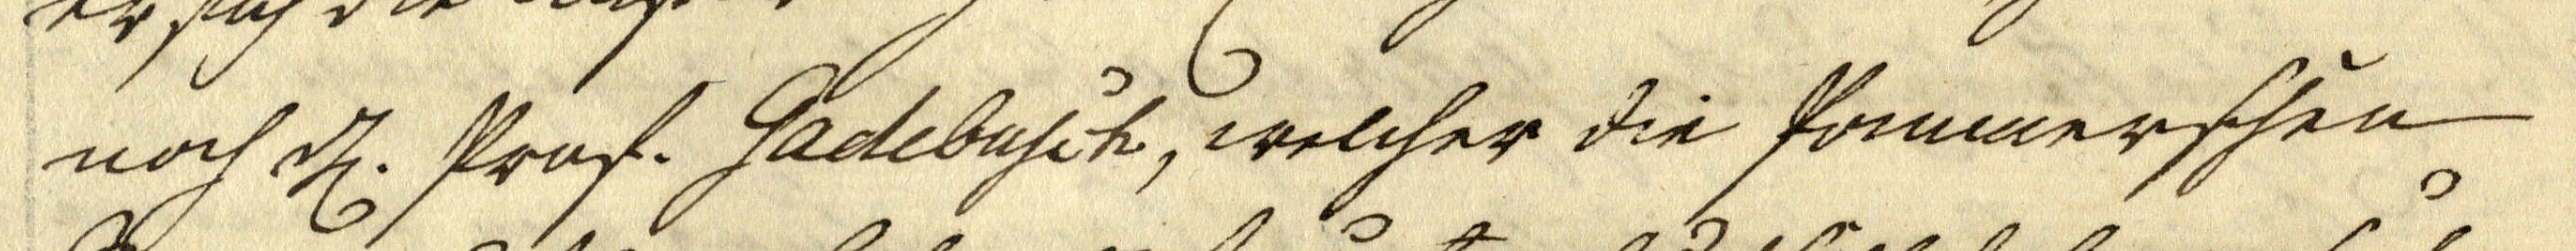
noch dh. Prof. Gadebusch, welcher die Pommerschen
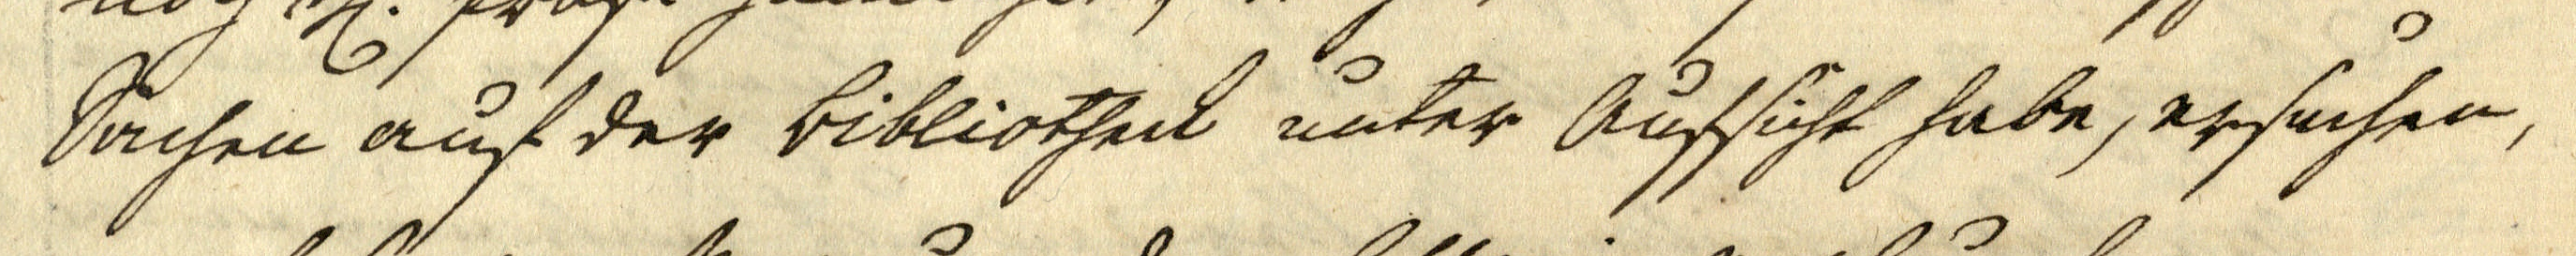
Sachen auf der Bibliothek unter Aufsicht habe, ersuchen
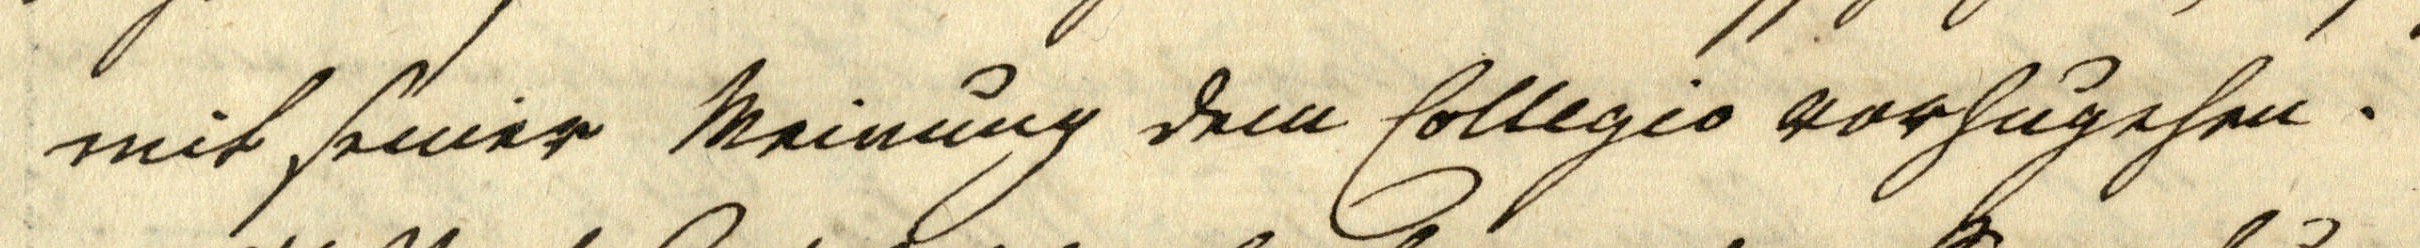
mit seiner Meinung dem Collegio vorzugehen.
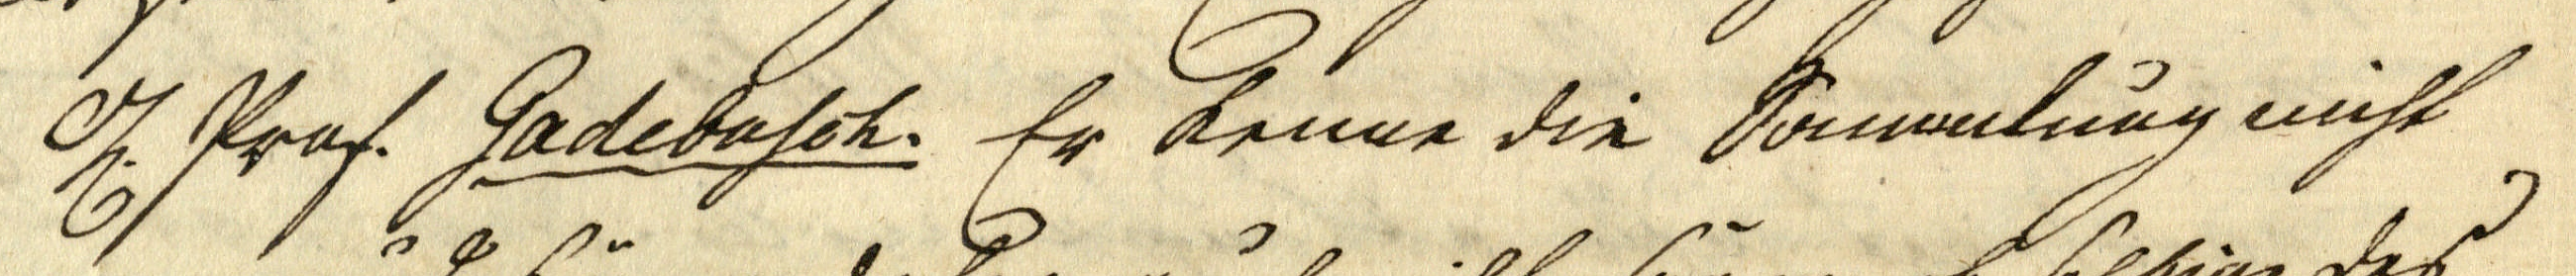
dh. Prof. Gadebusch. Er kenne die Sammlung nicht
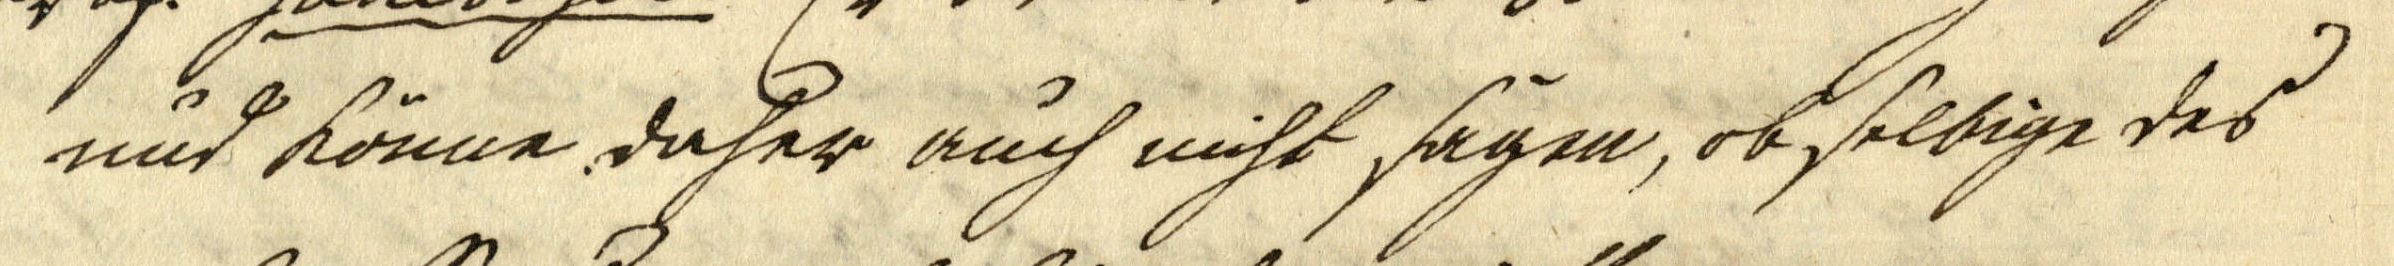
und könne daher auch nicht sagen, ob selbige des
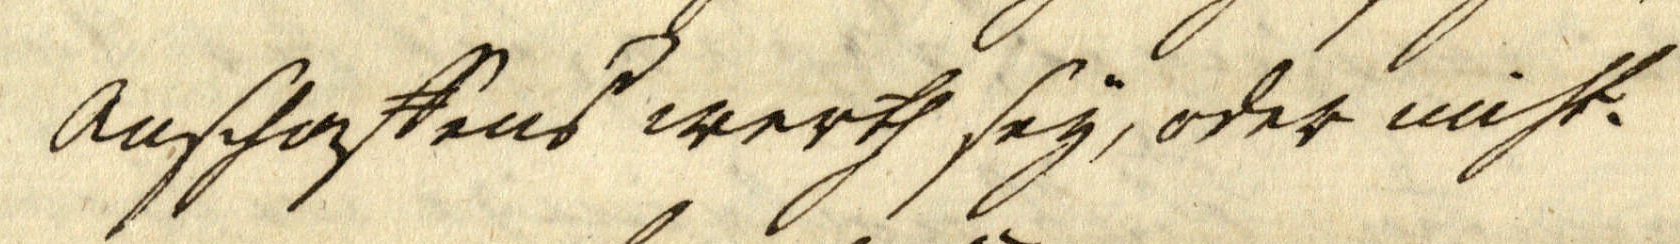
Anschaffens werth sey, oder nicht.
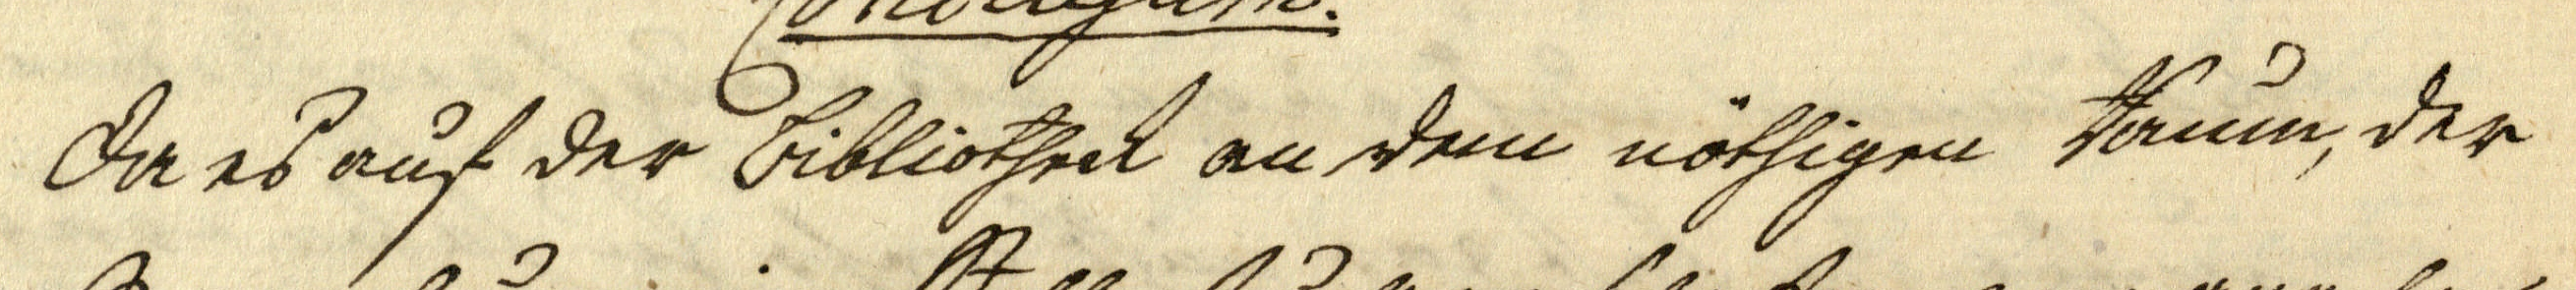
Da es auf der Bibliothek an dem nöthigen Raum, der
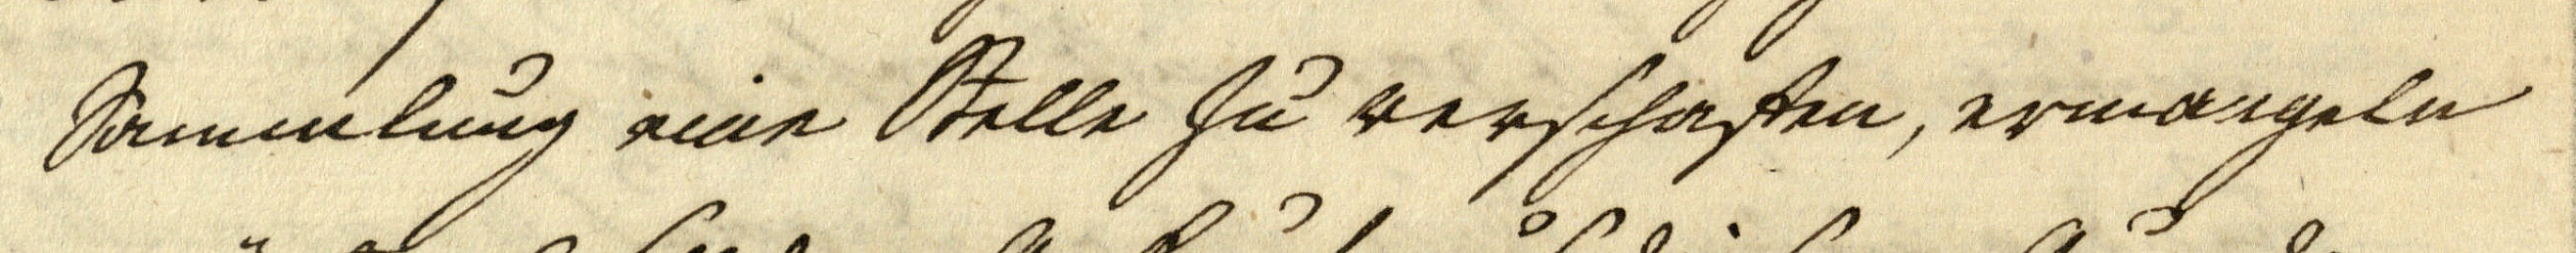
Sammlung eine Stelle zu verschaffen, ermangeln
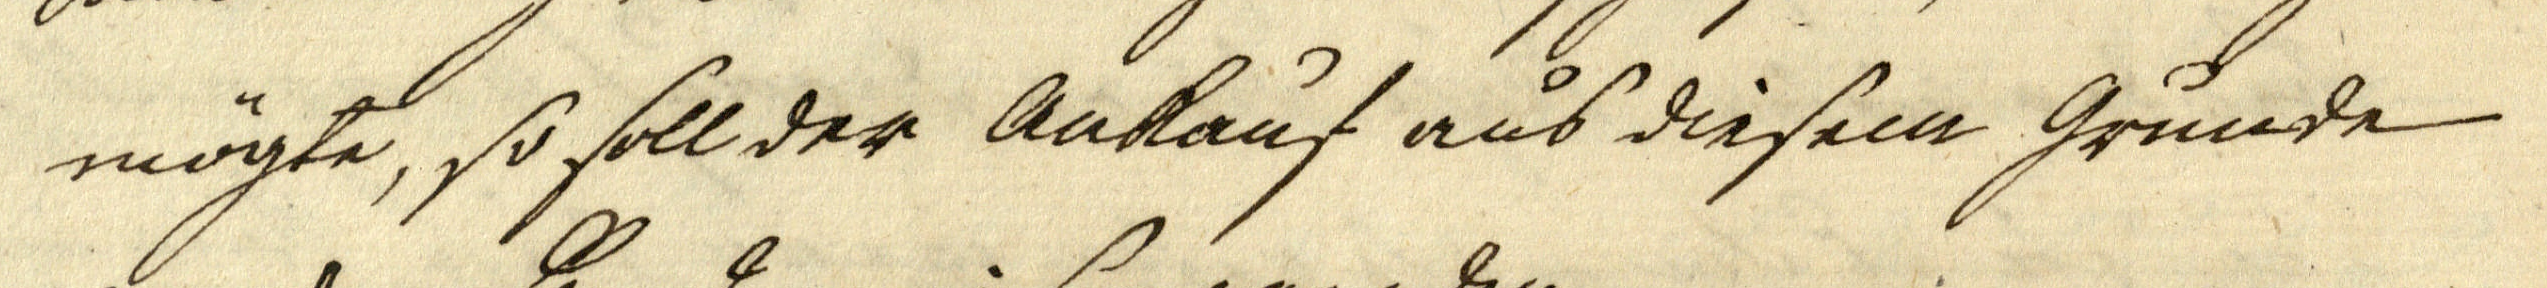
mögte, so soll der Ankauf aus diesem Grunde
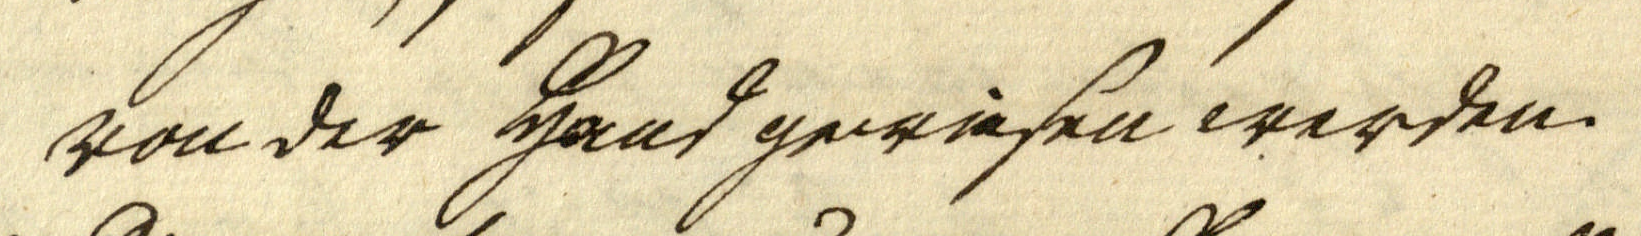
von der Hand gewiesen werden.
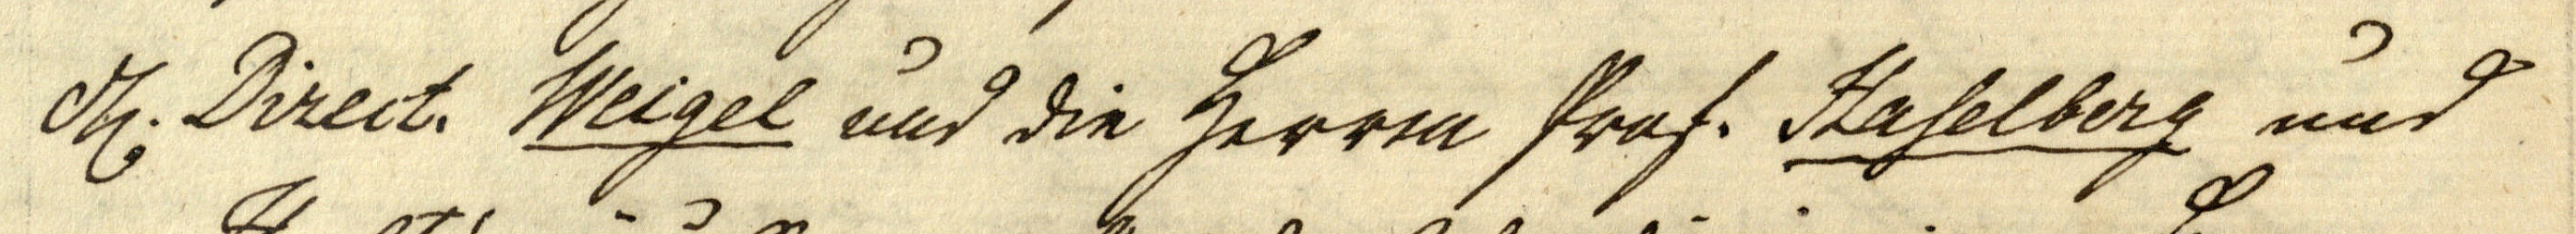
dh. Direct. Weigel und die Herren Prof. Haselberg und
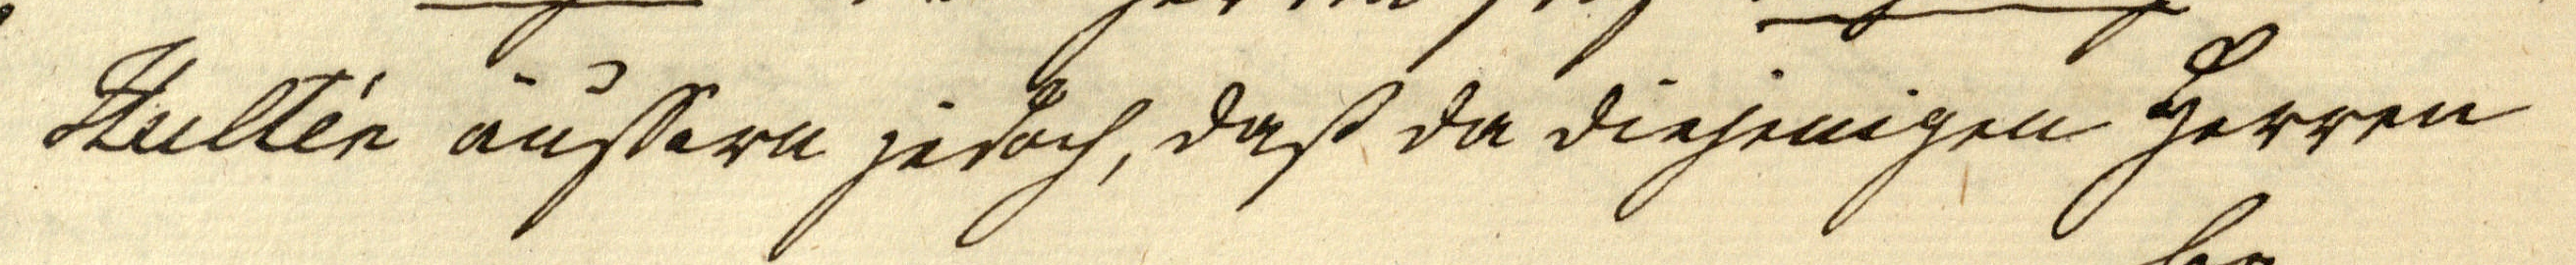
Hultén äussern jedoch, daß da diejenigen Herren
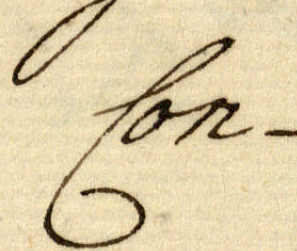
Con-
